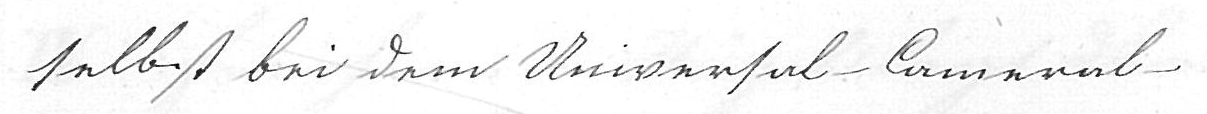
selbst bei dem Universal-Cameral-
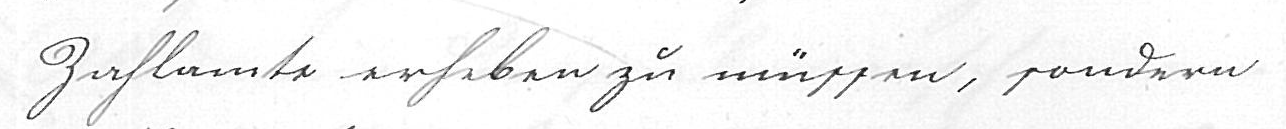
Zahlamte erheben zu müssen, sondern
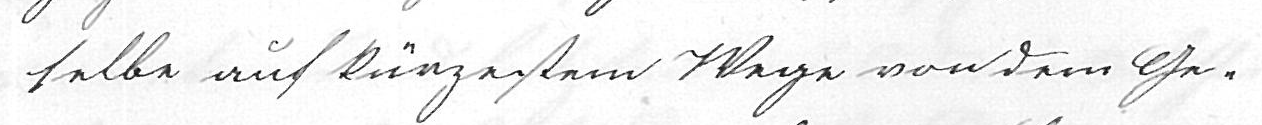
selbe auf kürzestem Wege von dem Ge-
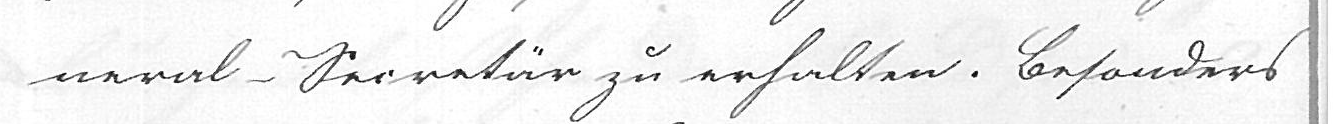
neral-Secretär zu erhalten. Besonders
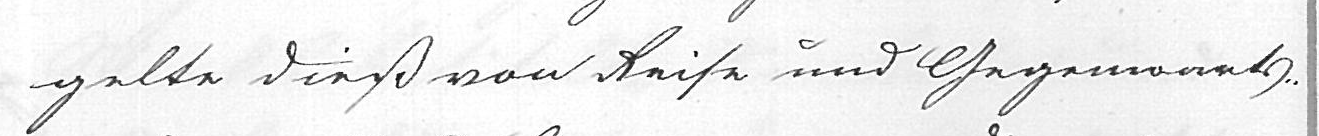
gelte dieß von Reise und Gegenwarts-
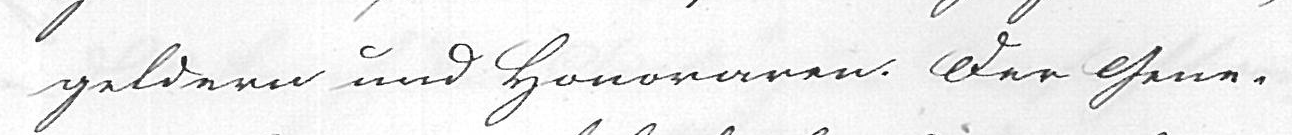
geldern und Hnoraren. Der Gene-
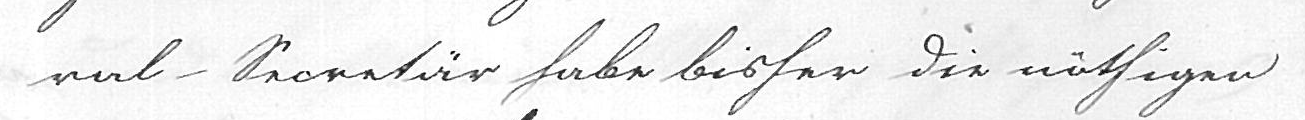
ral-Secretär habe bisher die nöthigen
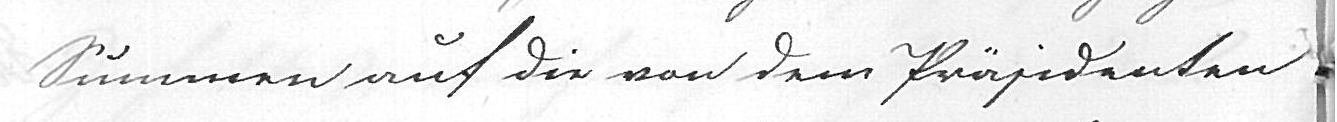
Summen auf die von dem Präsidenten
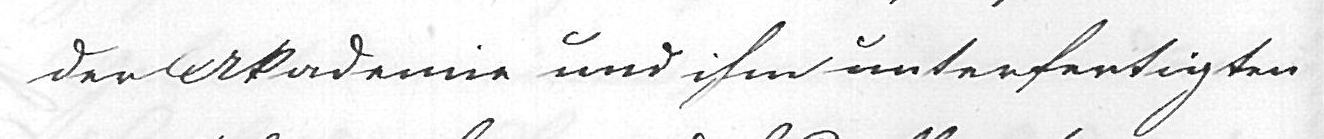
der Akademie und ihm unterfertigten
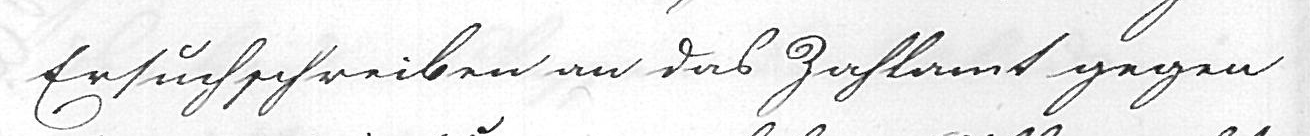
Ersuchschreiben an das Zahlamt gegen
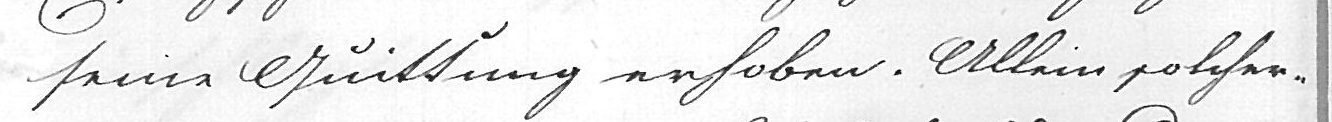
seine Quittung erhoben. Allein solcher-
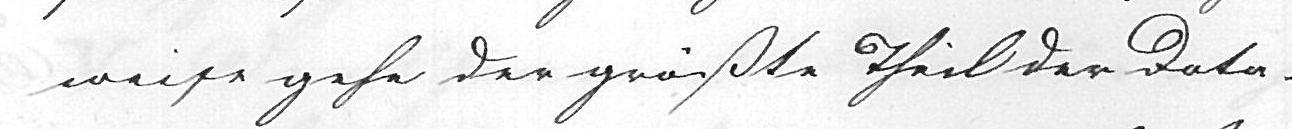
weise gehe der größte Theil der Dota-
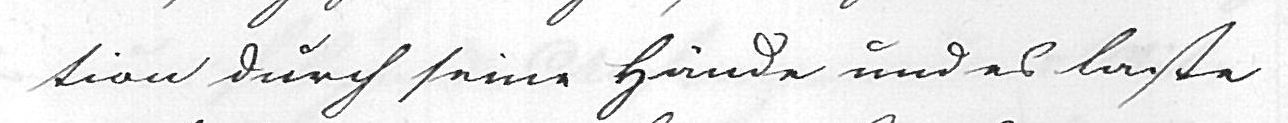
tion durch seine Hände und es laste
